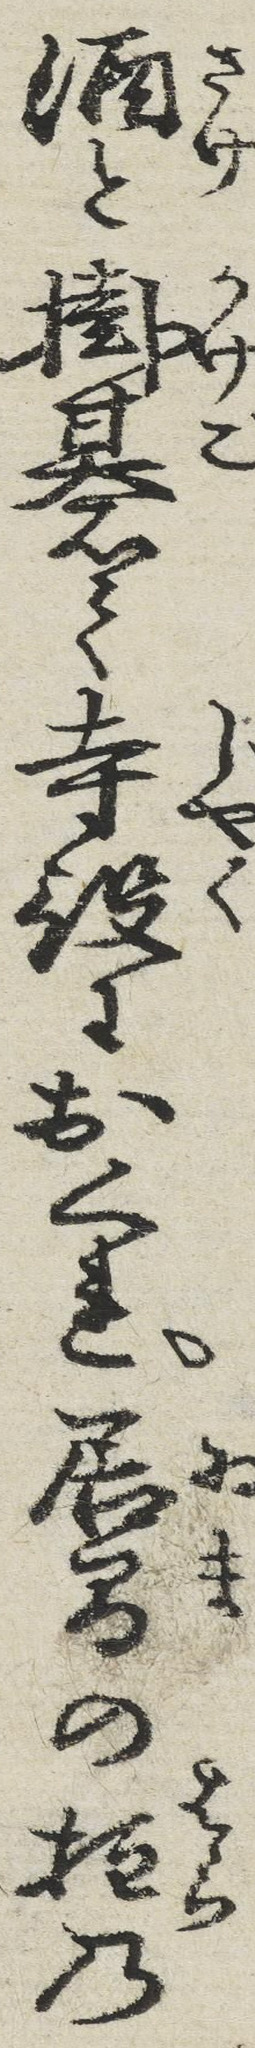酒と掛碁て寺役におくれ。居間の柱の
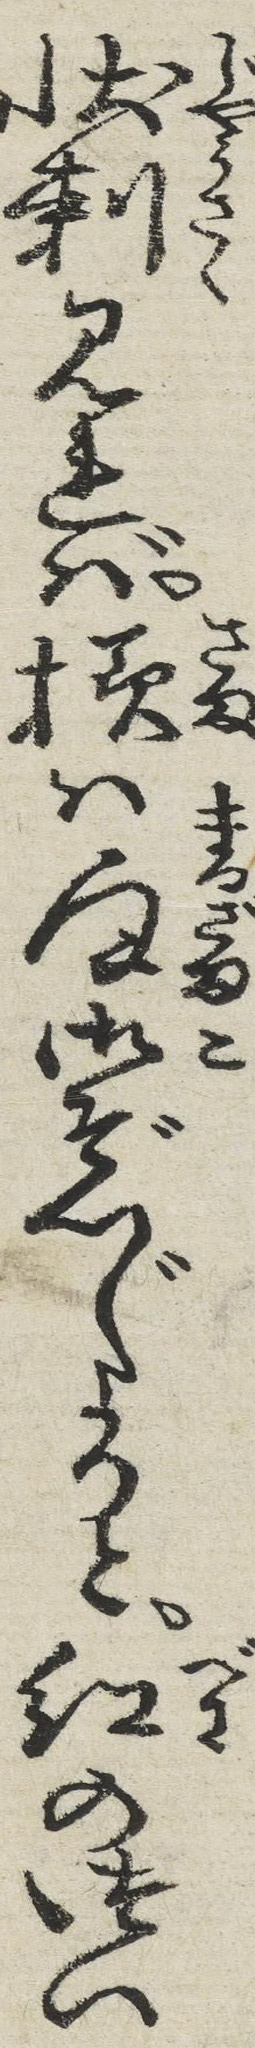状刺みれば。様は為？御ぞんじよりと。紅のつい
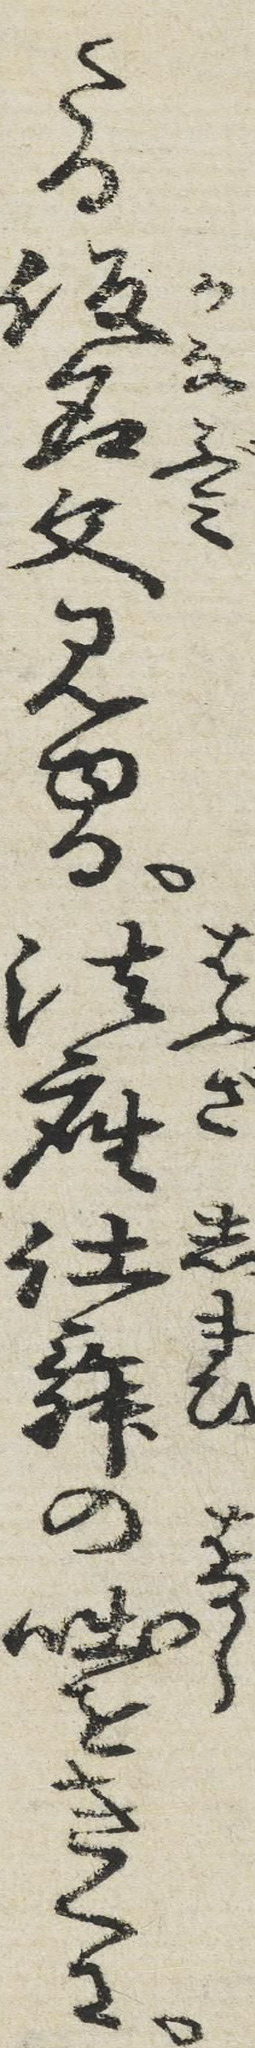たる仮名文見ゆる。法座仕舞の咄をきくに。
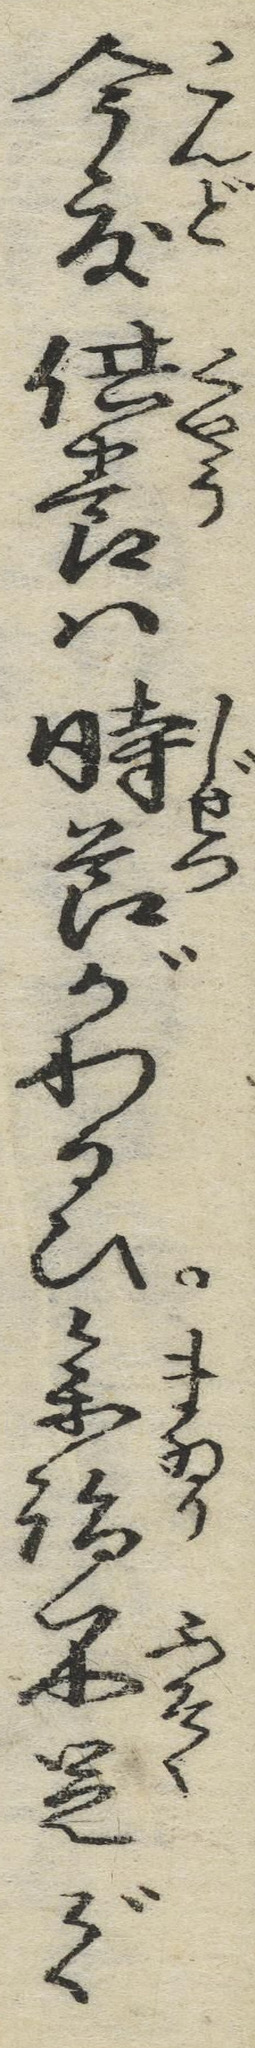今度供養は時節がわるい。参詣不足で
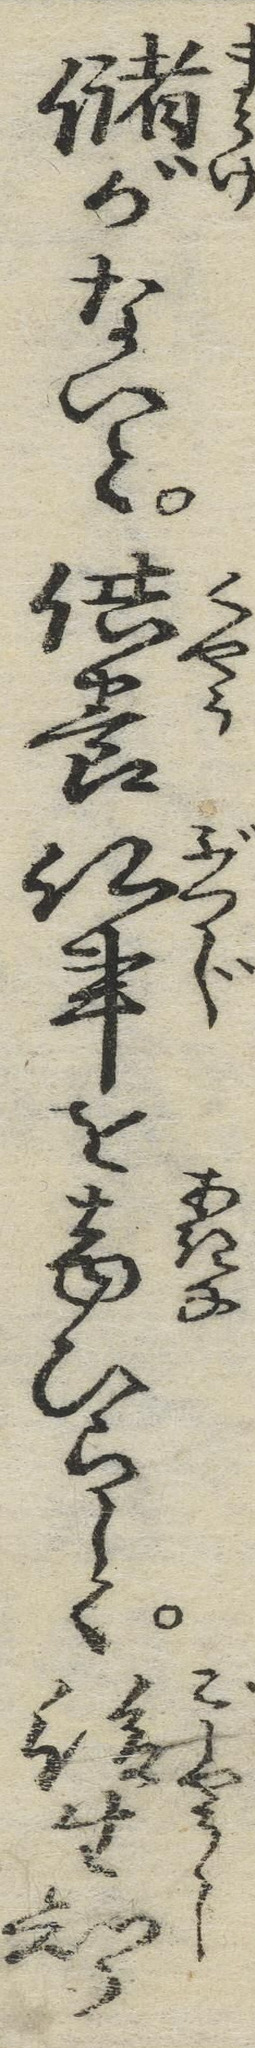儲がないと。供養仏事を商ひらしく。後生知ら
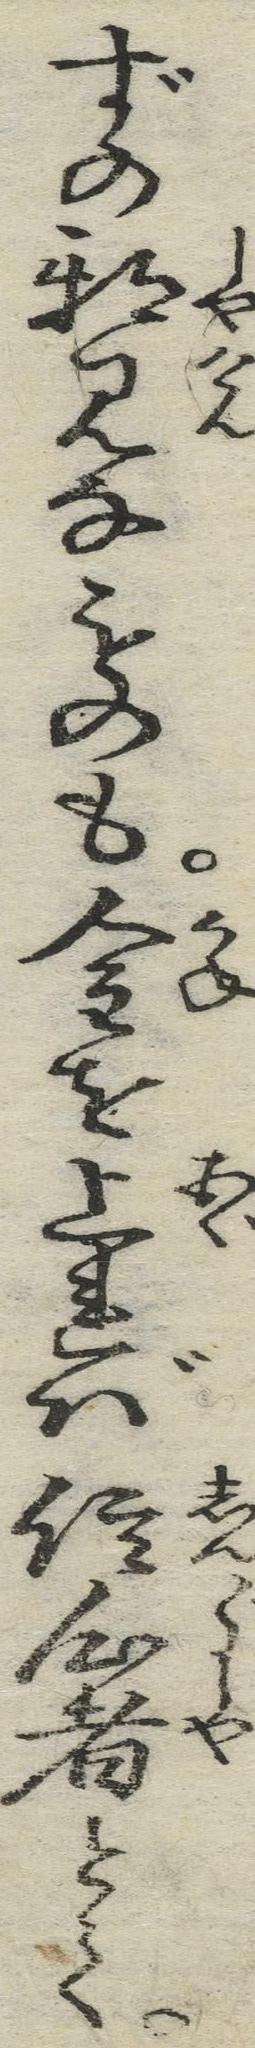ずの邪見なものも。金を上れば信心者とて。
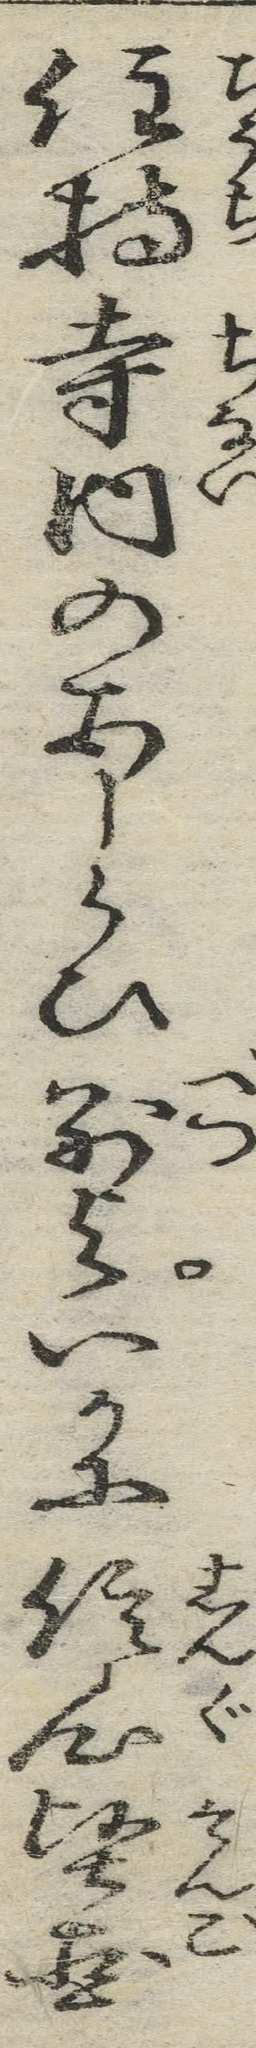住持寺内のあしらひ別よ。いかに信心堅固
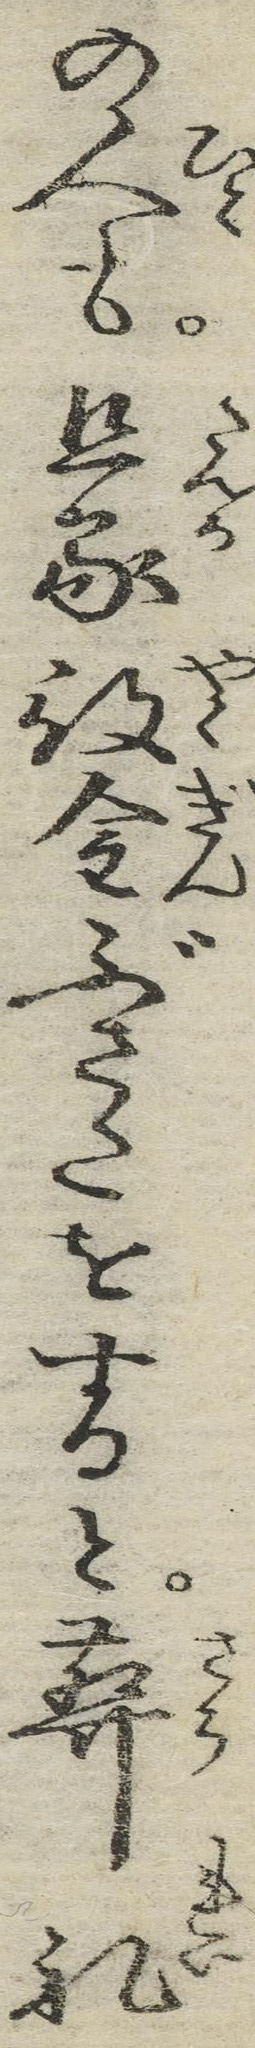の人も。旦家役金ぶさたをすると。葬礼
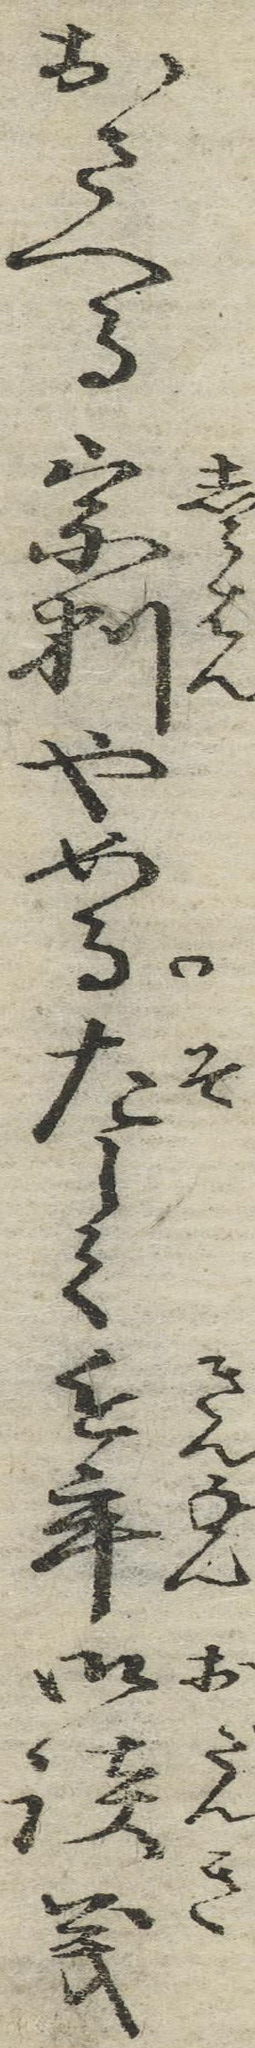おさへる宗判やめる。左して近年御談義
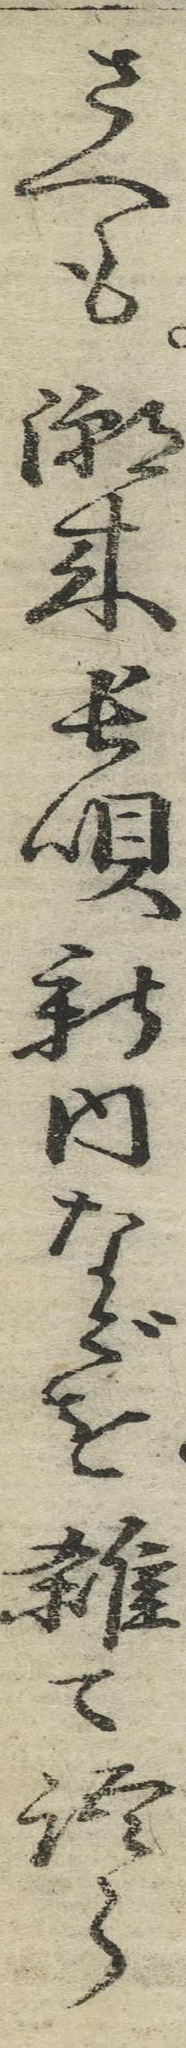さへも。潮来長唄新内などを。雑て語ら

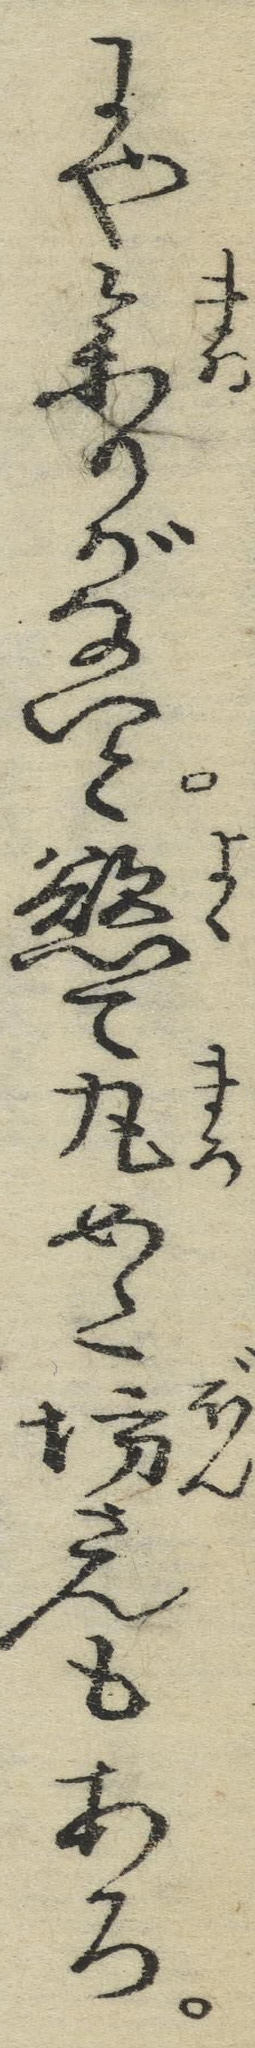にや参りがないと。慾て丸めた防さんもあろ。
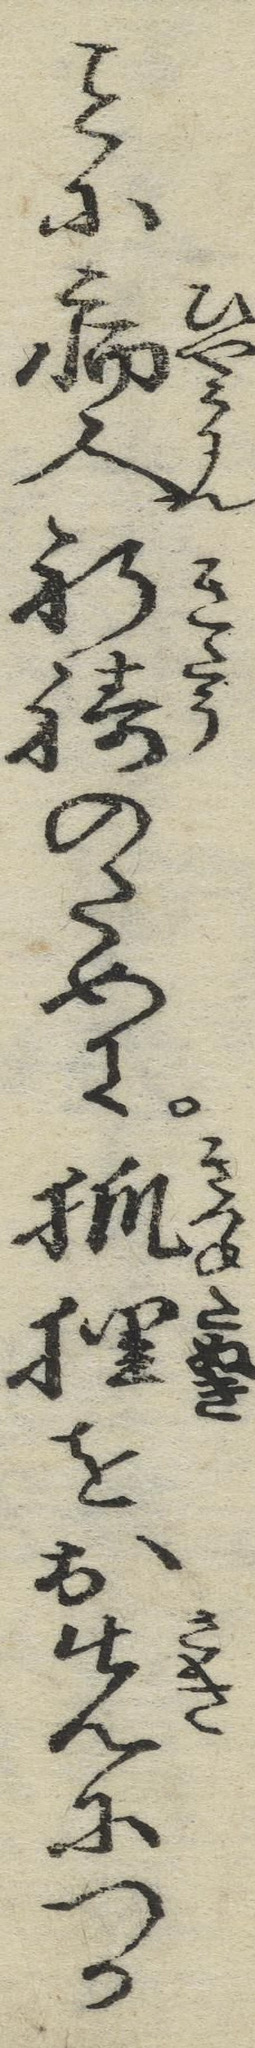ことに病人祈祷のために。狐狸をお先につか
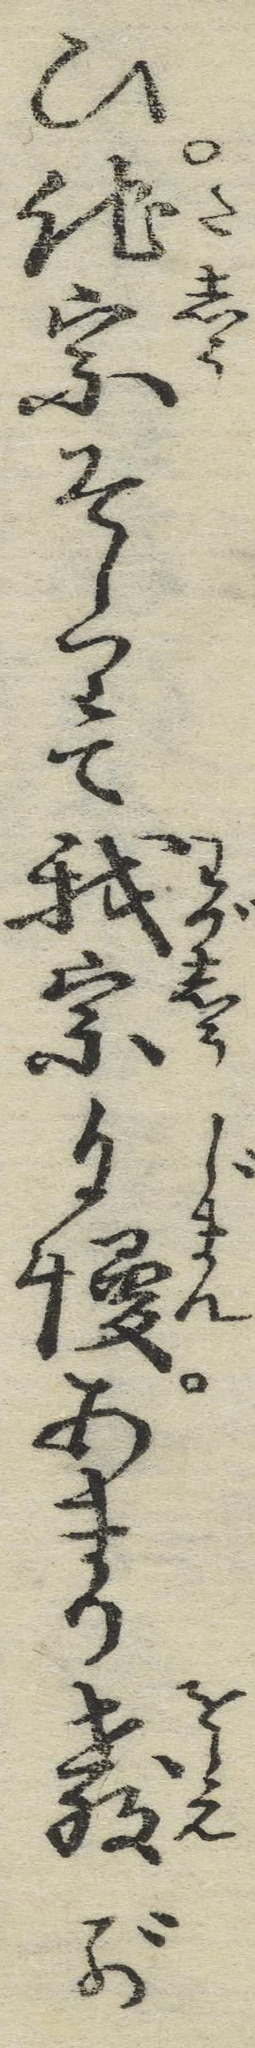ひ。他宗そしりて我宗自慢。あまり教が
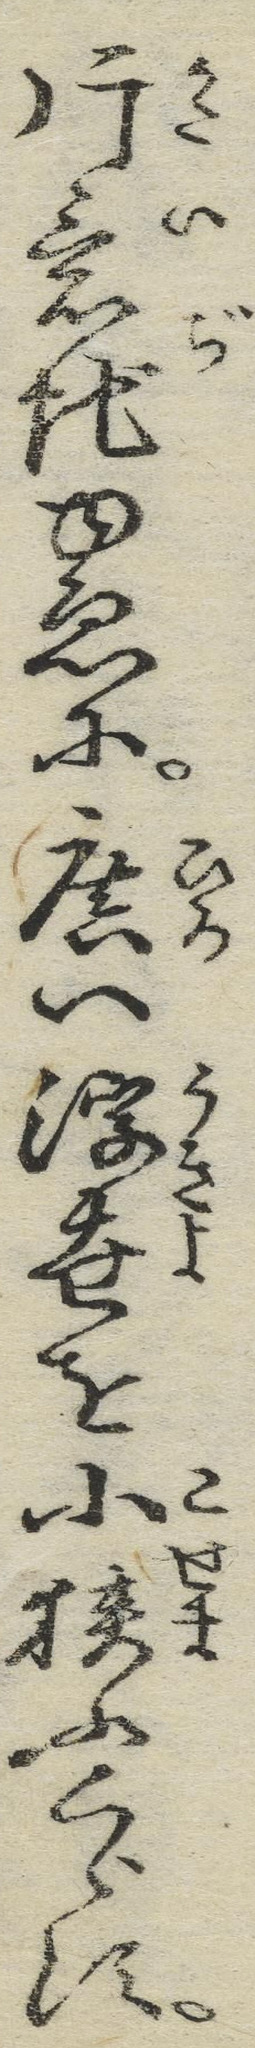片意地ゆゑに。広い浮世を小狭にくらす。
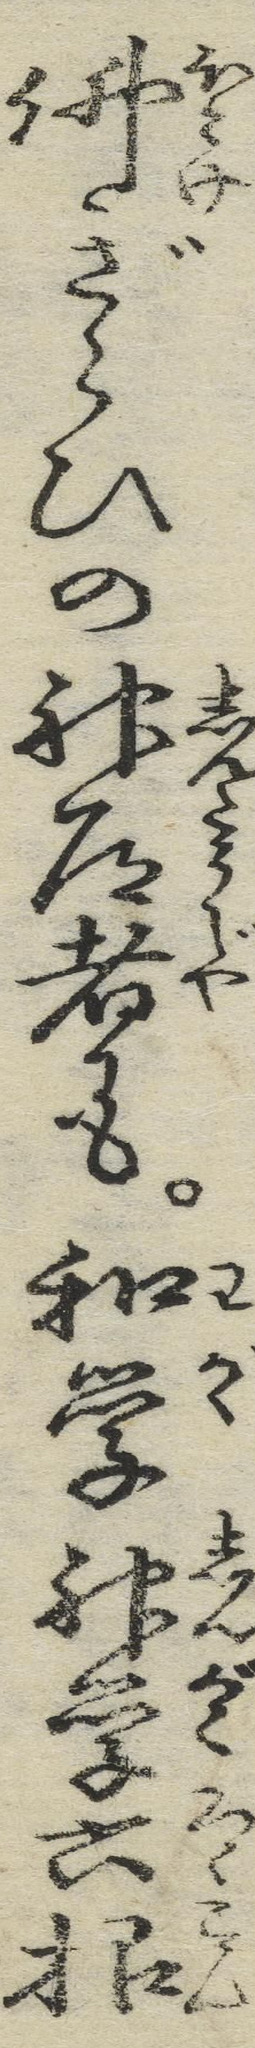佛ぎらいの神道者にも。和学神学六根
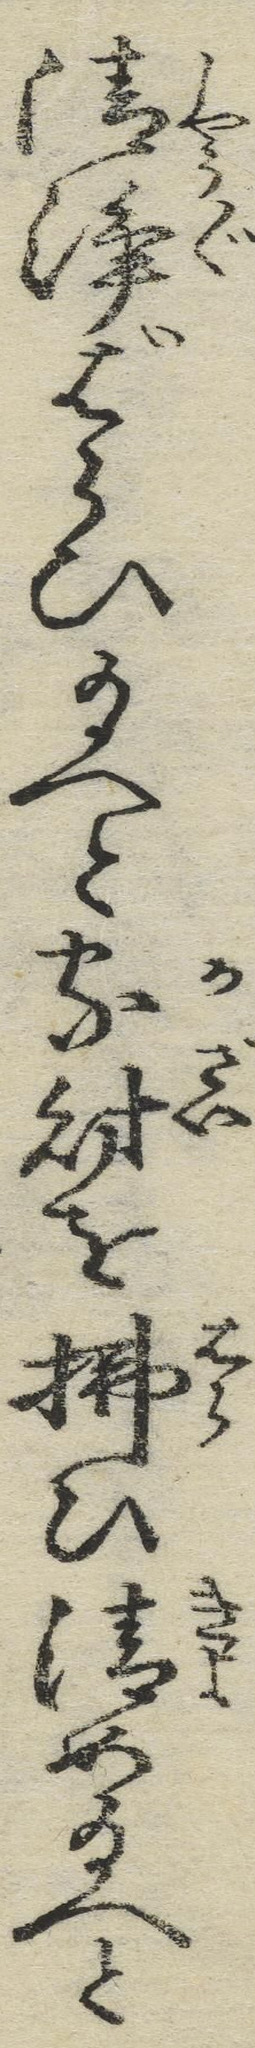清浄ばらひ給へと家財を拂ひ清め給へと
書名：越後地震口説
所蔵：東京大学地震研究所図書室 Earthquake Research Institute Library, The University of Tokyo, JAPAN
